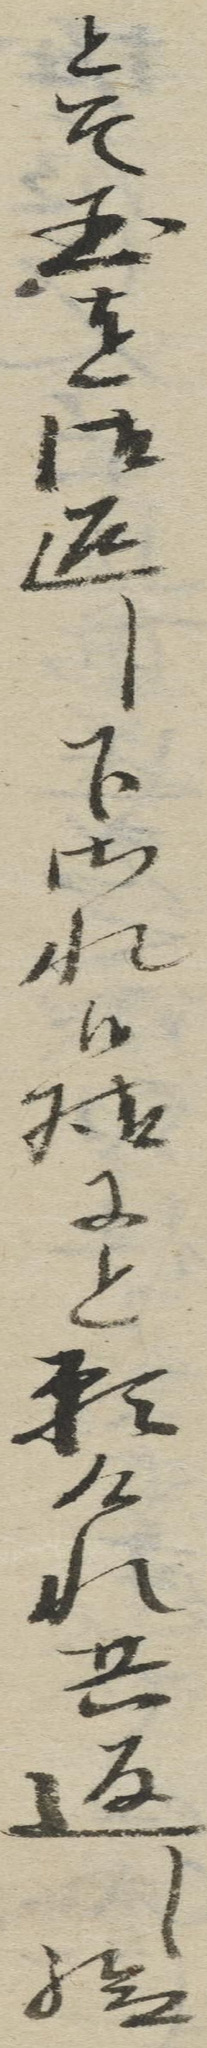とそ玉を御返し下され候様にと頼けれ共返し給
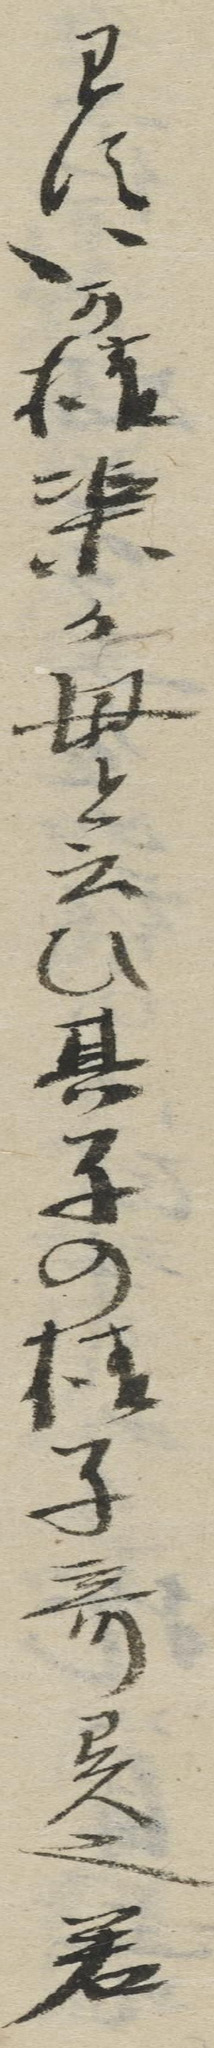わすいか様拒か母と云ひ其子の様子奇異也若
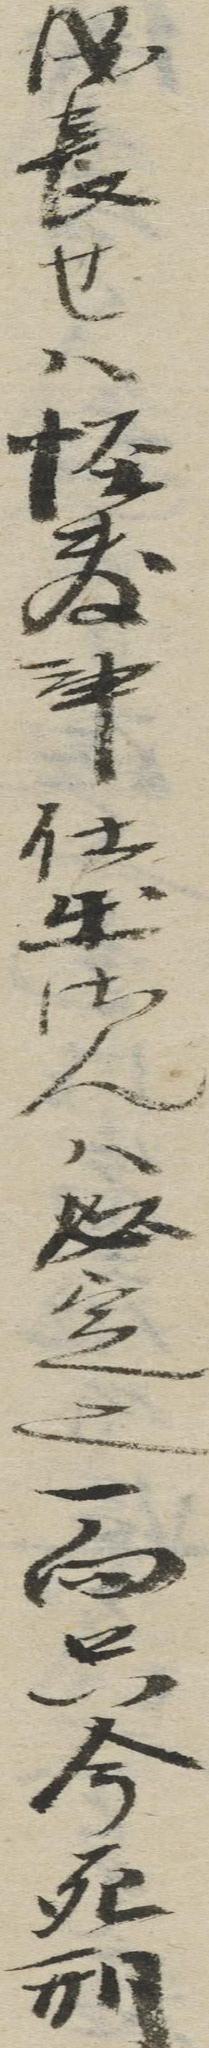成長せハ怪敷事仕出さんハ必定也一向只今死刑
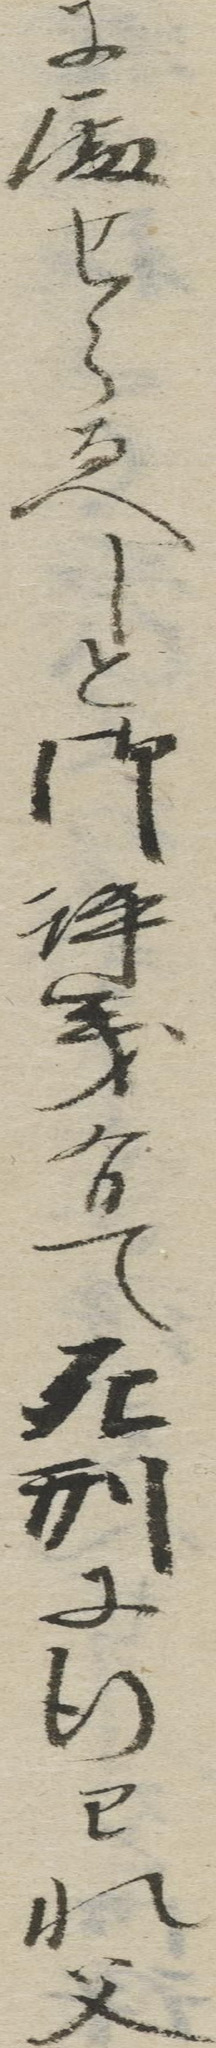に処セらるへしと御評義有て死刑に行われ父
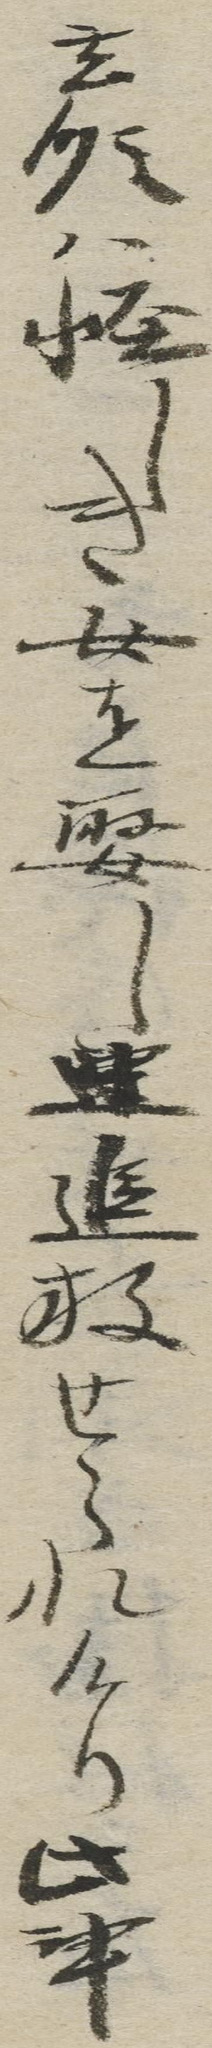玄順ハ怪しき女を娶し迚追放せられけり此事
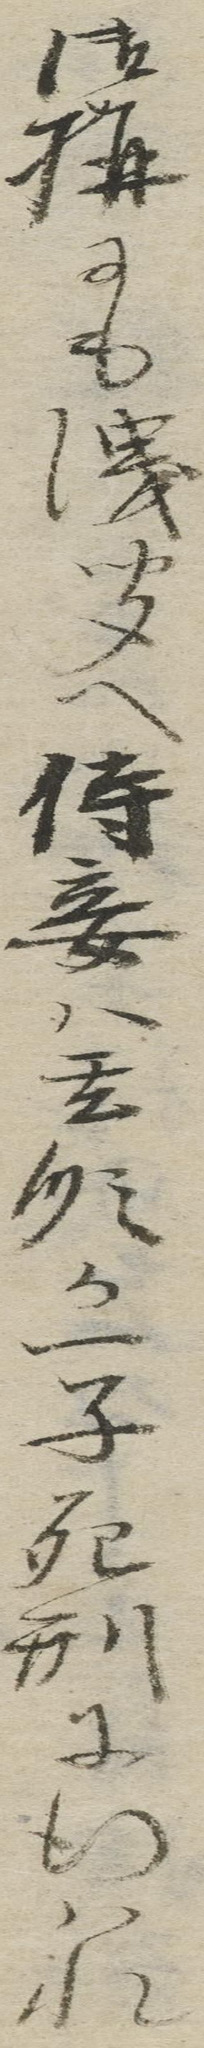御構にも洩聞へ侍妾ハ玄順か一子死刑に行ハれ
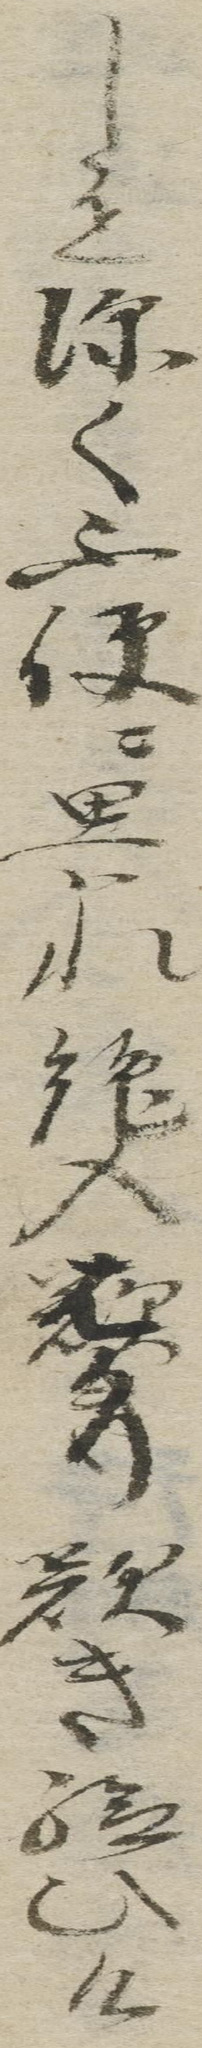しを深く不便ニ思ハれ絶入はかり歎き給ひけ
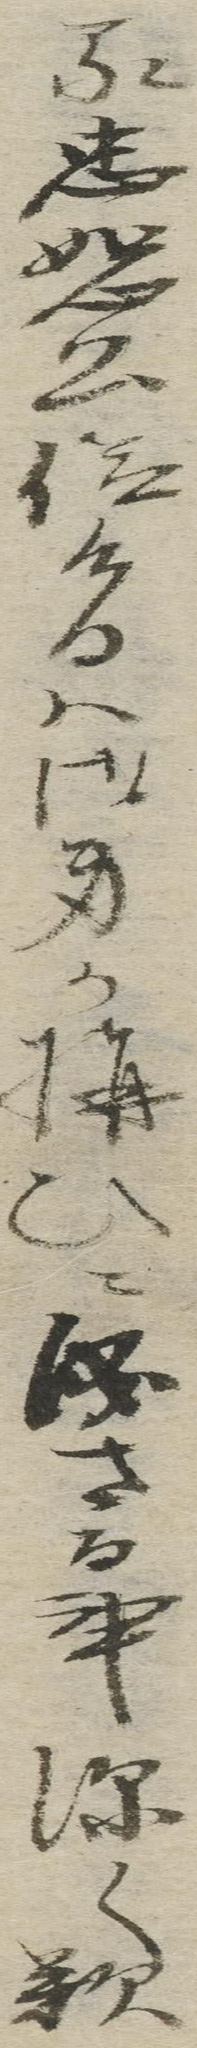る忠恕公仰けるハ御身か構ひニ洩さる事弥深く歎
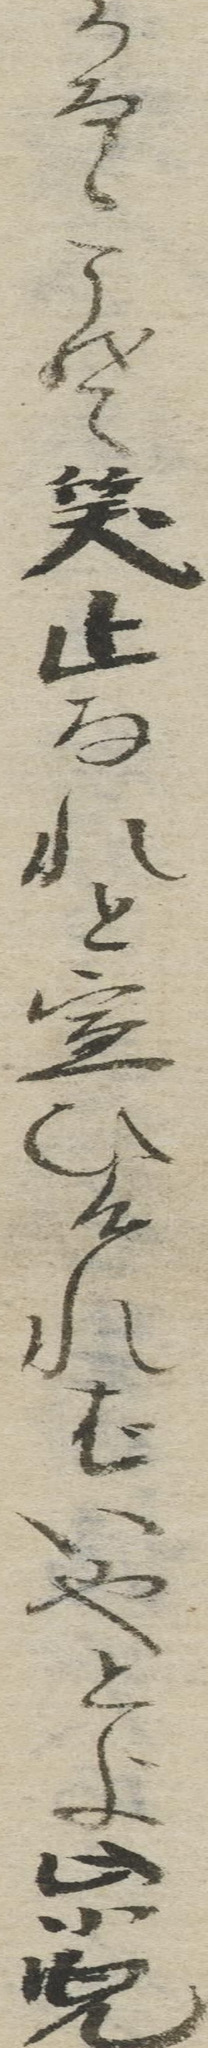けるこそ笑止なれと宜ひければいやとよ此小児
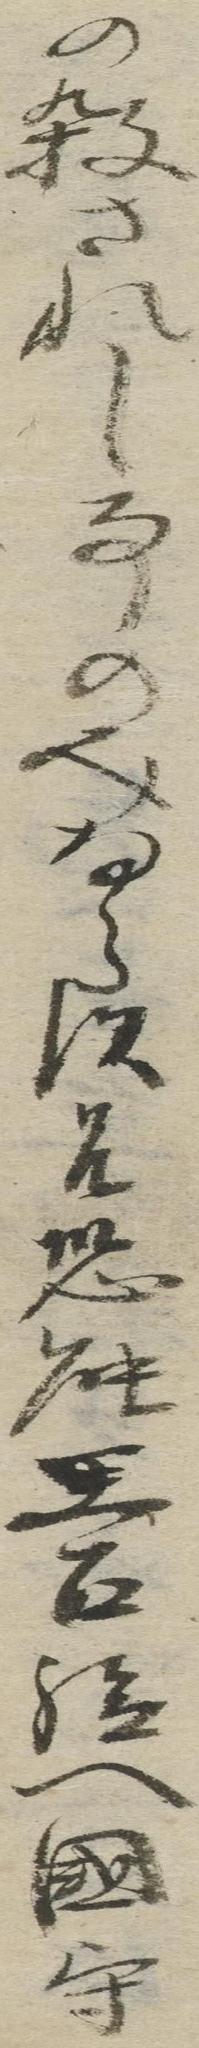の殺されし事のみならす乍恐能思召給へ国守
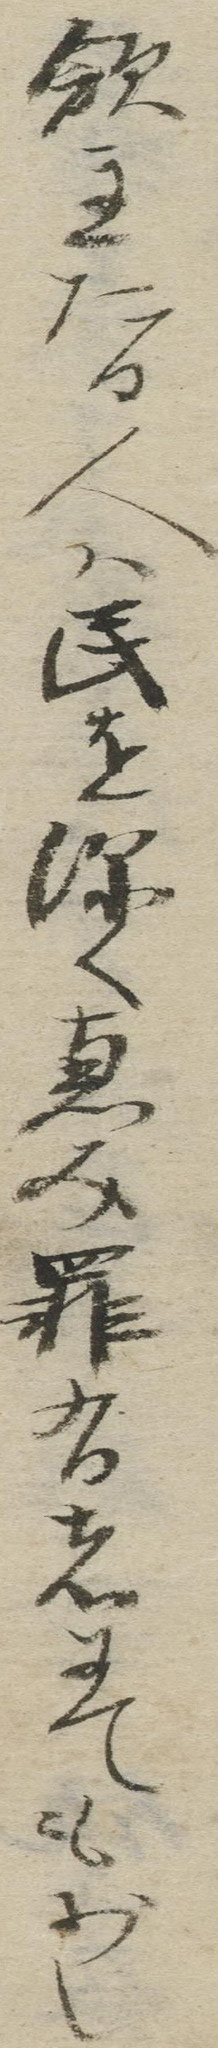領主たる人ハ民を深く恵み罪有者にても少し
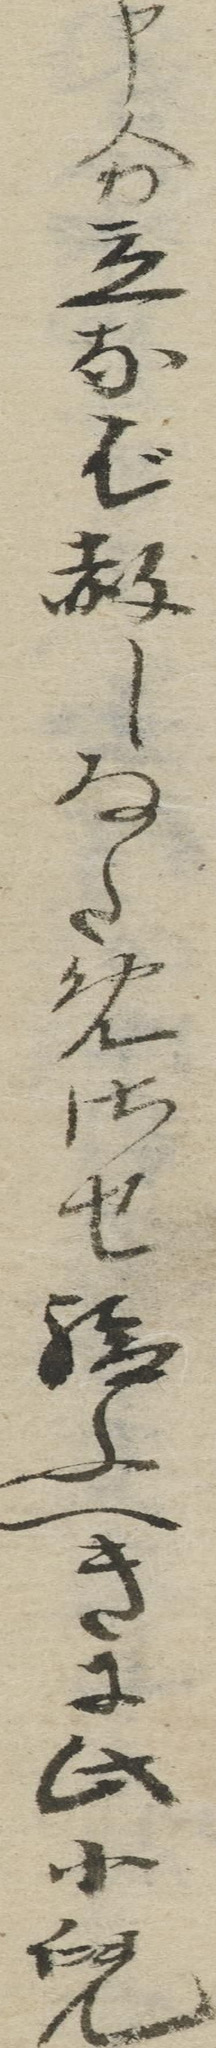申分立なば赦しなためさセ給ふへきに此小児

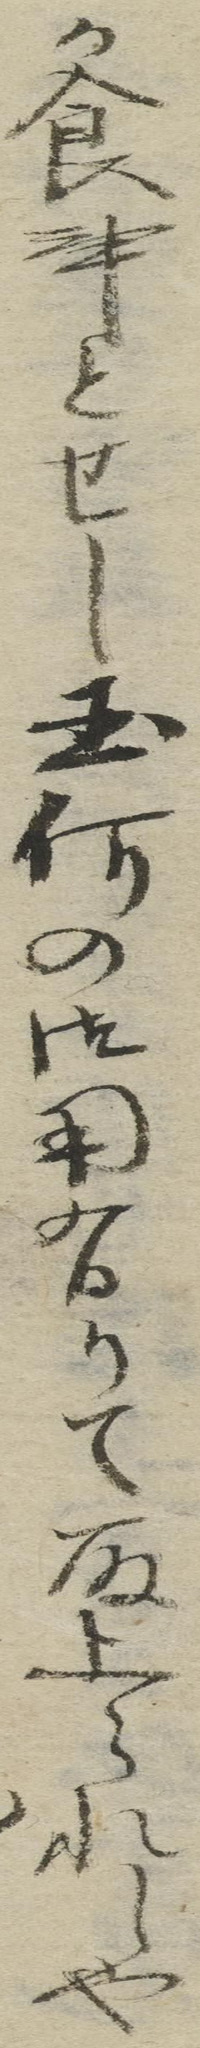か食事とせし玉何の御用有りて取上られしや
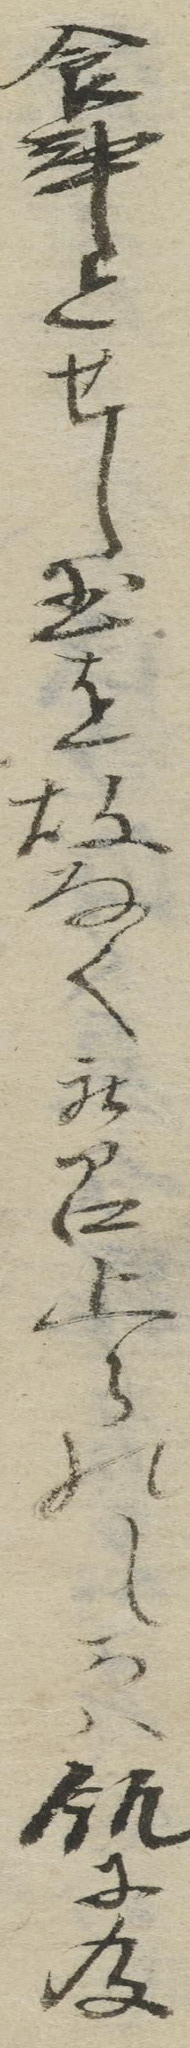食事とせし玉を故なく被召上られしてハ飢に及
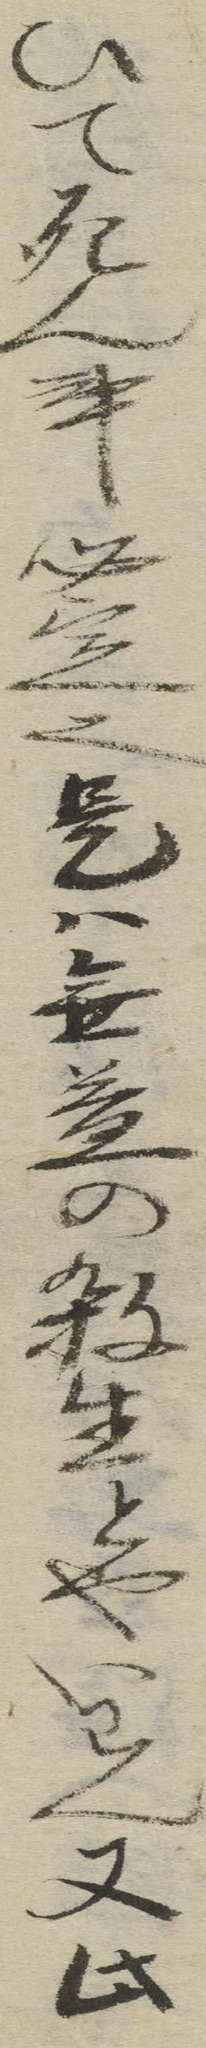ひて死ん事必定也是ハ無益の殺生とやいわん又此
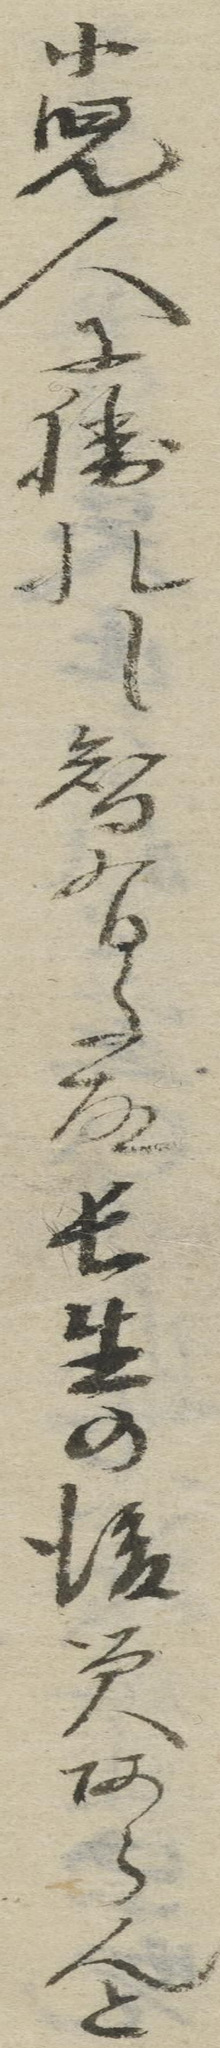小児人に勝れし智有る故長生の後災あらんと
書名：肥前國島原領普賢山大変記　完
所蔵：東京大学地震研究所図書室 Earthquake Research Institute Library, The University of Tokyo, JAPAN
